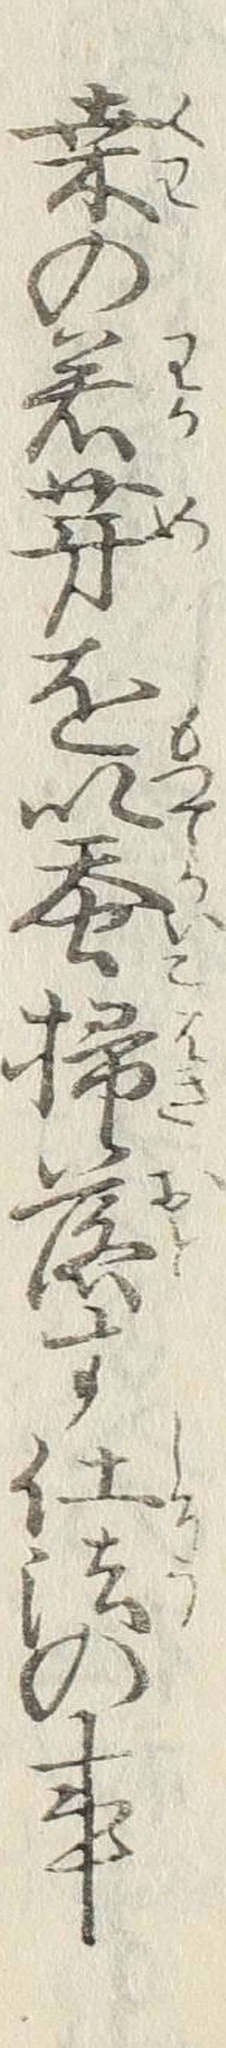桑の若芽を以蚕掃落す仕法の事
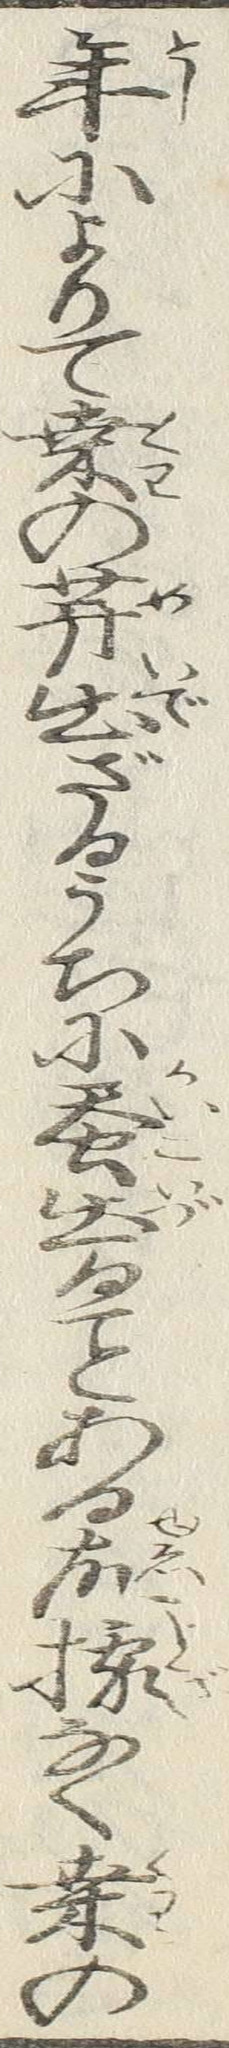年によりて桑の芽出ざるうちに蚕出ることある故據なく桑の
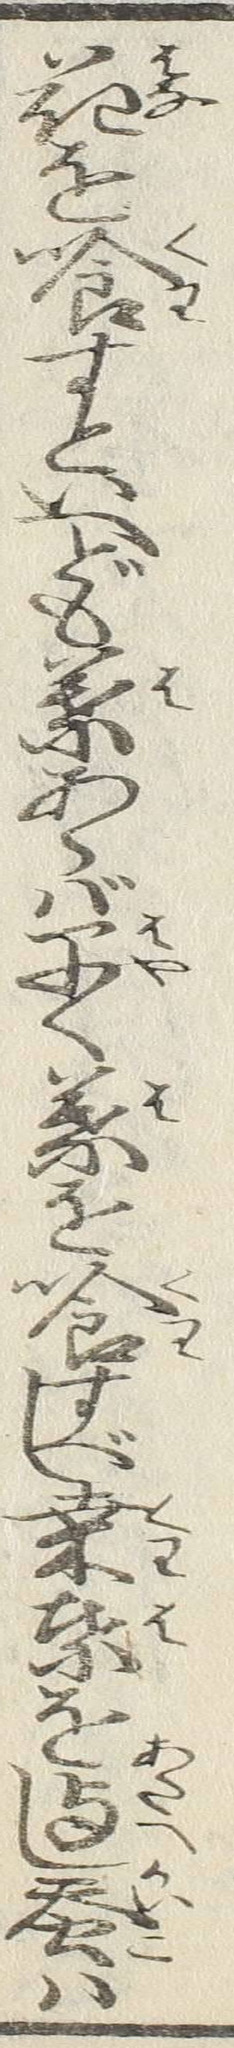花を喰すといへども葉あらば早く葉を喰すべし桑葉を与し蚕は
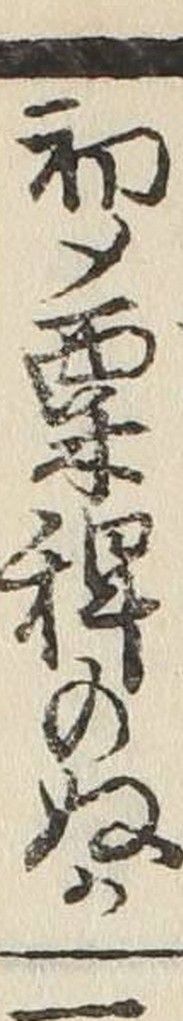初メ粟稗のぬか
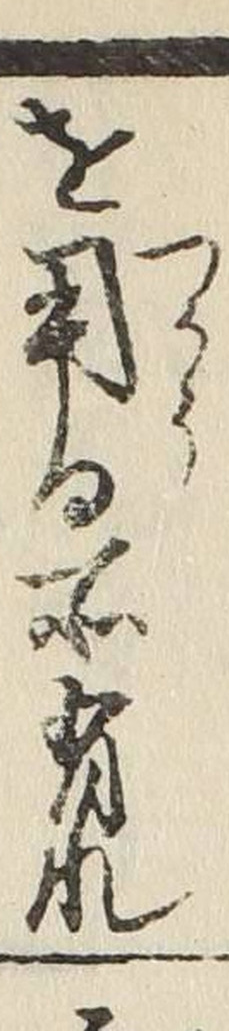を用る所有れ
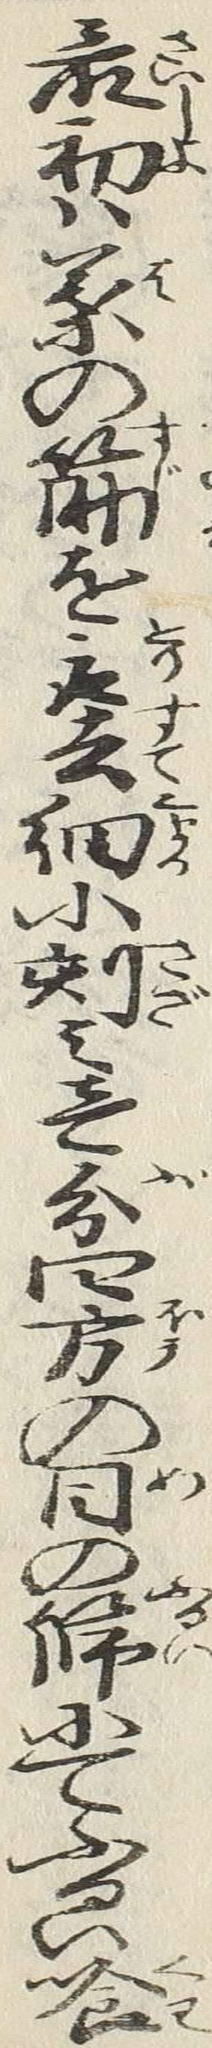最初は葉の筋を取去細に刻み壱分四方の目の篩にてふるい喰
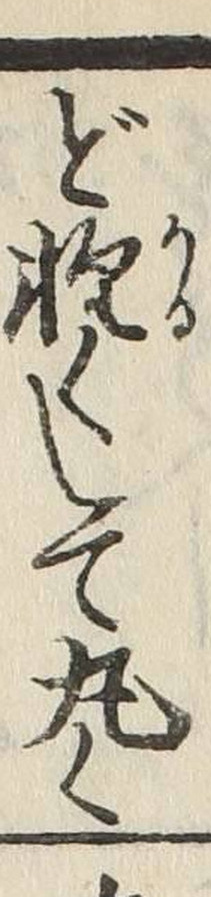ど軽くして丸く
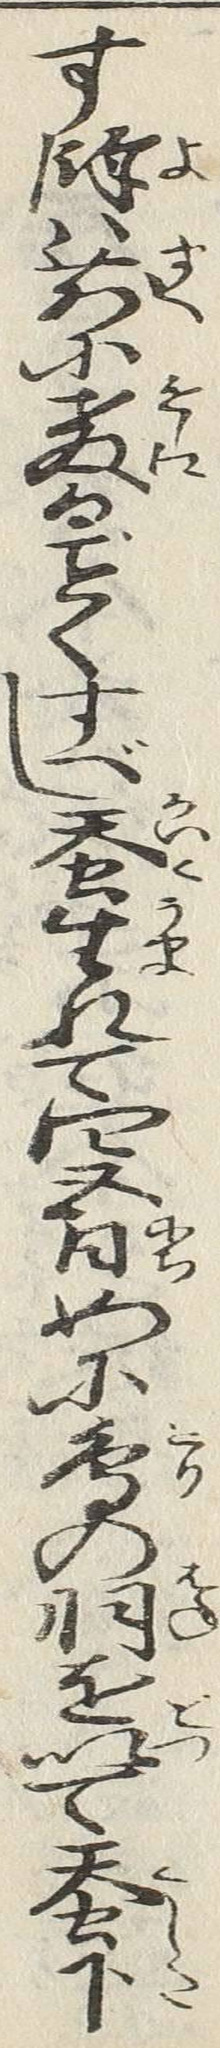す餘は前に教るごとくすべし蚕生れて四五日めに鳥の羽を以て蚕下
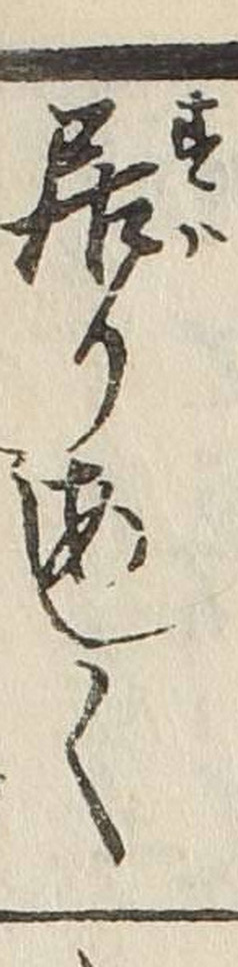居りあしく
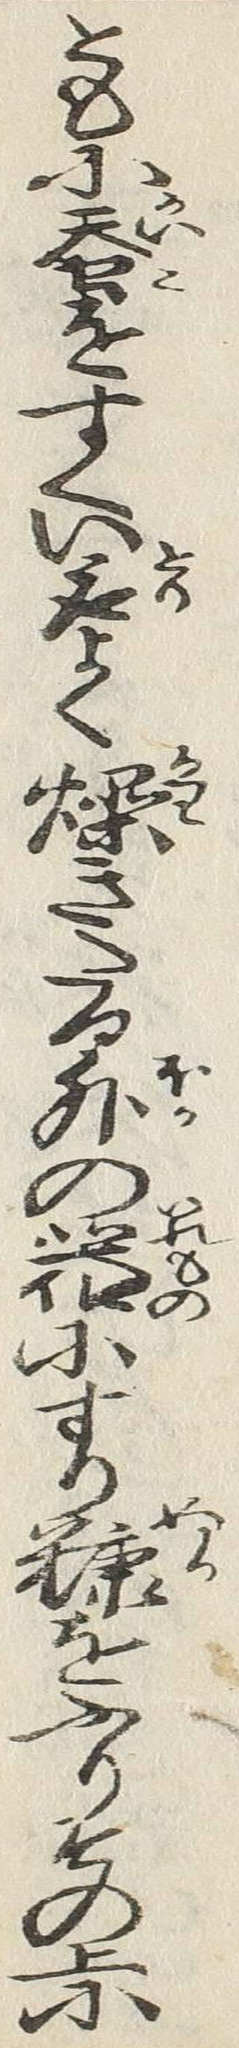ともに蚕をすくい取よく燥きたる外の器にすり糠をふりその上に
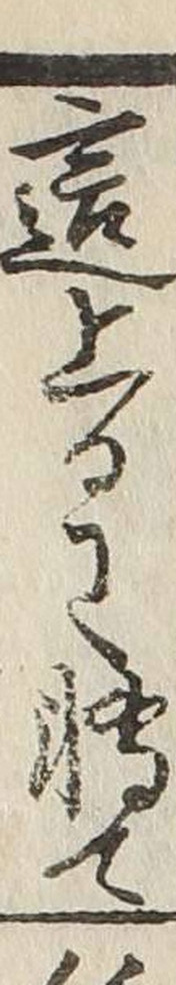這上るに轉て
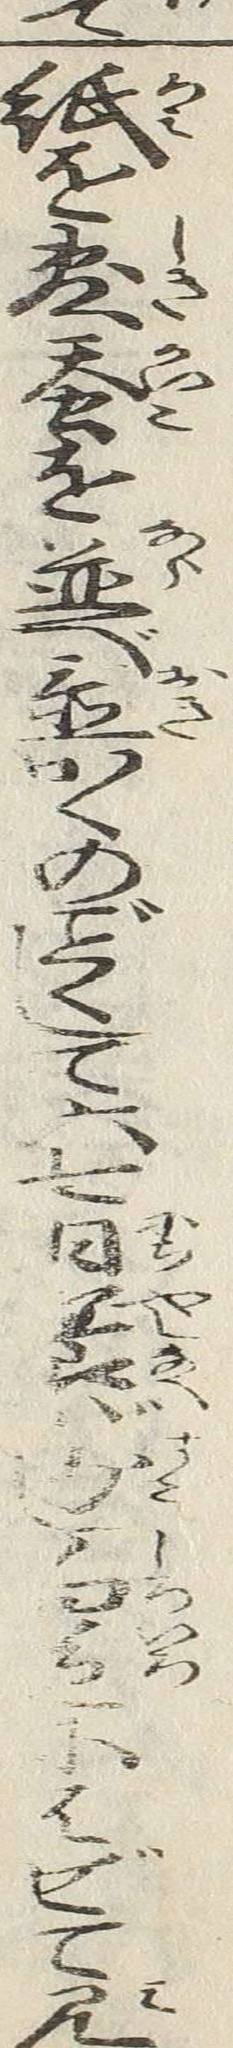紙を敷蚕を並べ置かくのごとくして六七日養ば少し白色にはぜて見
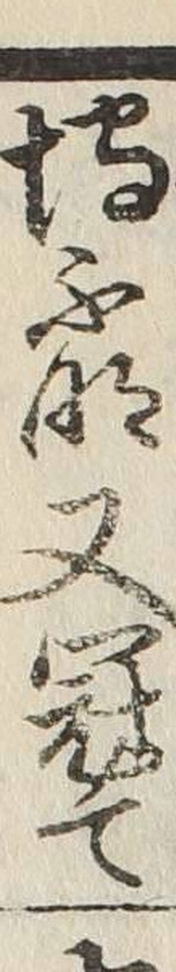埒不明又冠て
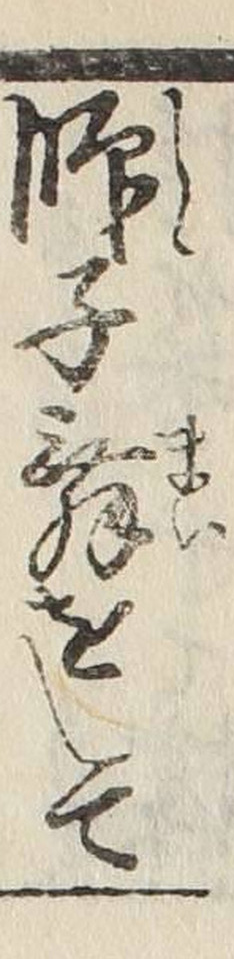師子舞をして
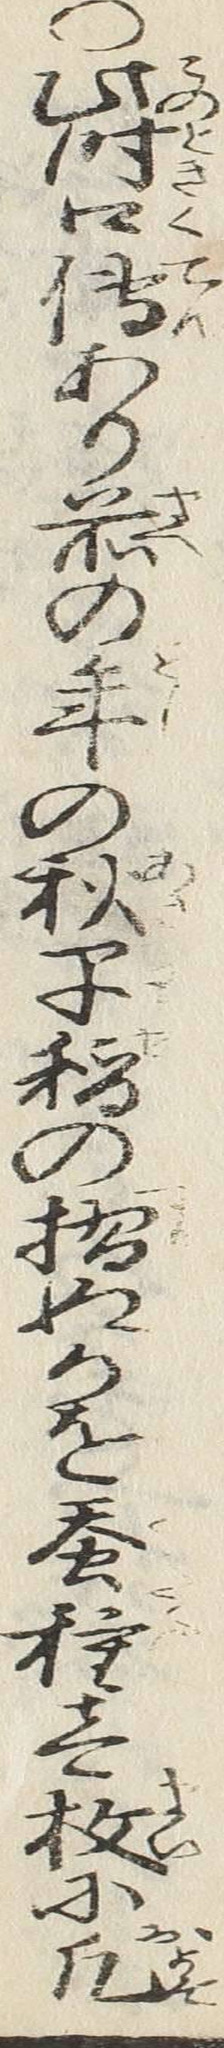○此時口傳あり前の年の秋早稲の摺ぬかを蚕種壱枚に凡
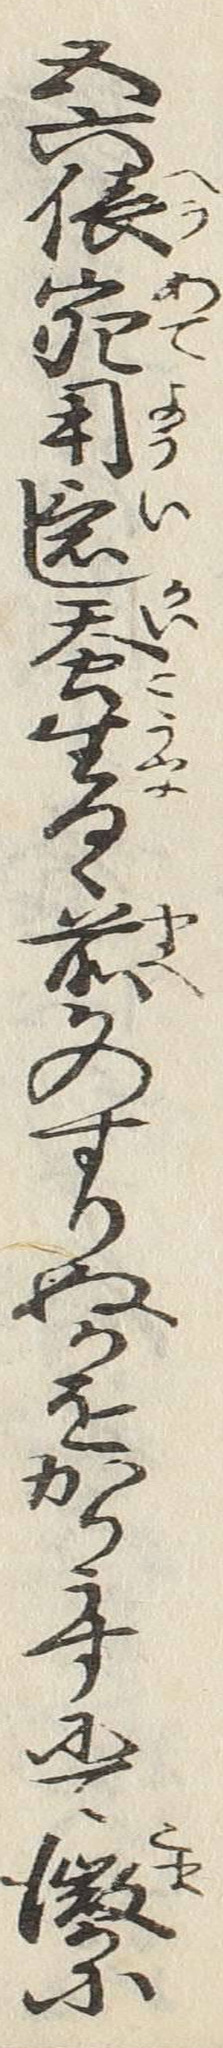五六俵宛用意し蚕生るゝ前かのすりぬかをかりうすにて微かに
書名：養蠶實驗録
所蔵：東京大学農学生命科学図書館 国文学研究資料館
